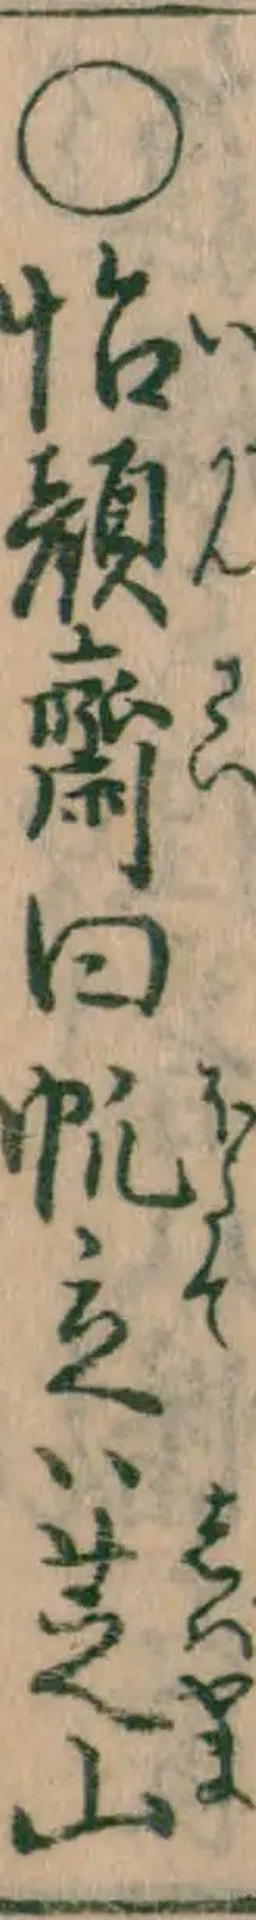○怡顔斎曰帆立は芝山
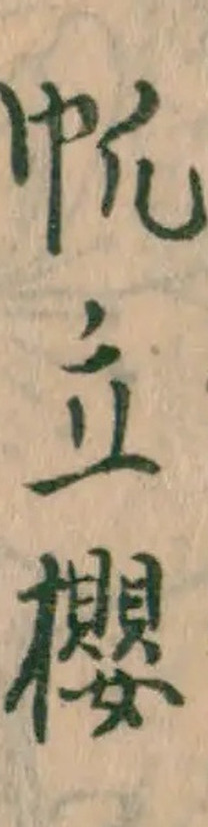帆立桜
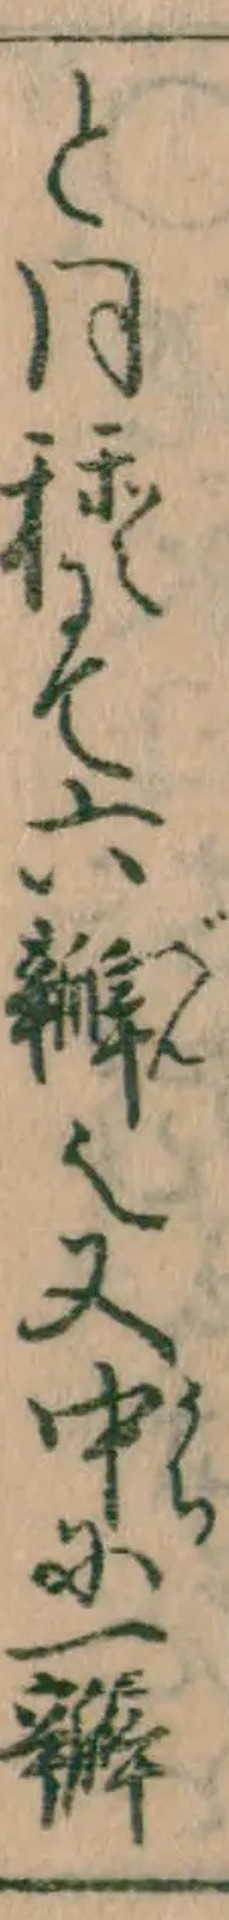と同種にて六弁也又中に一弁
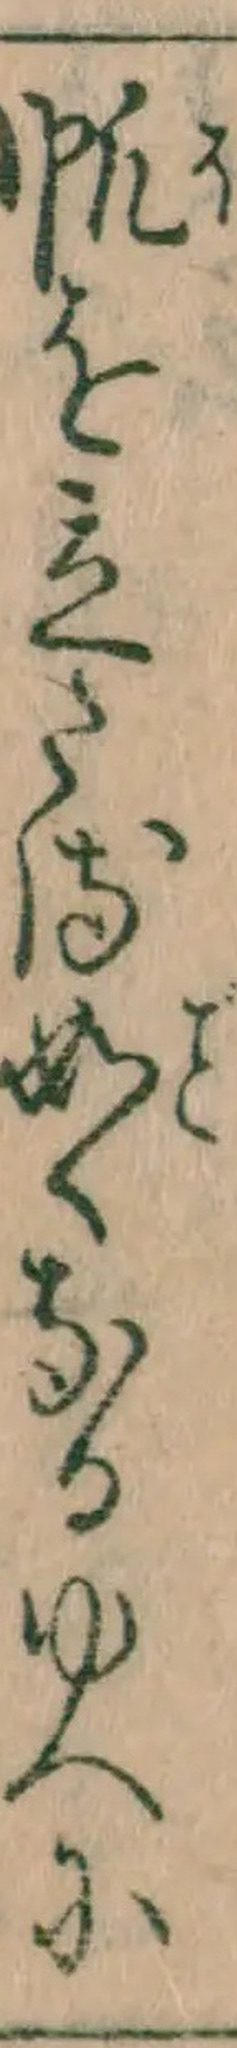帆を立たる如くなるゆへに
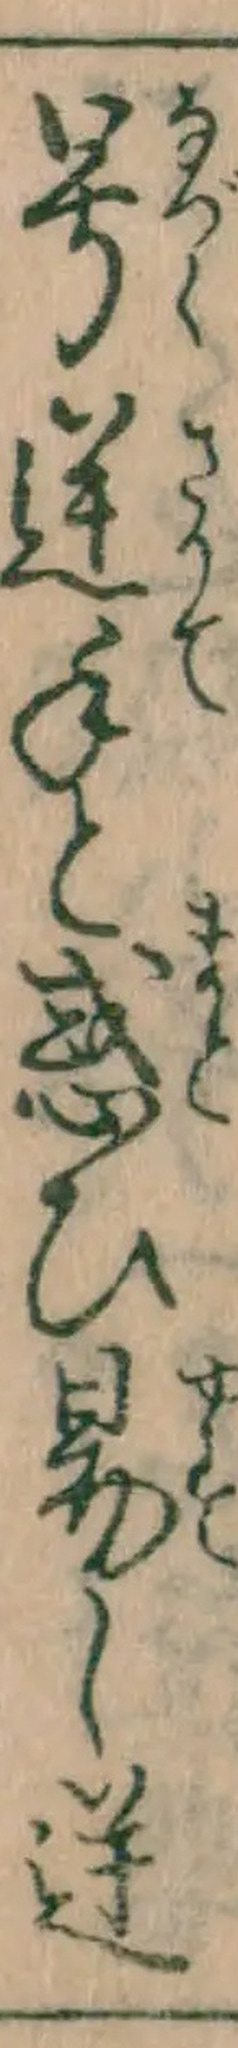号逆手と惑ひ易し逆
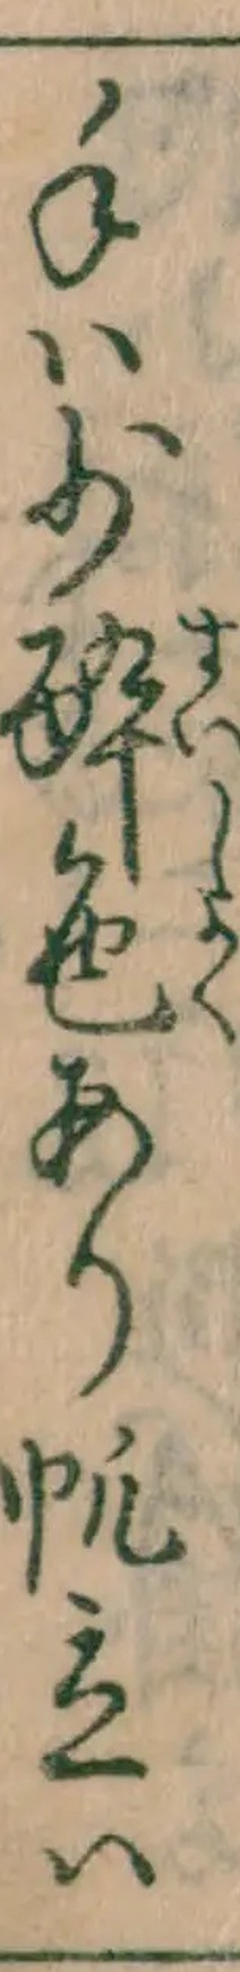手は少酔色あり帆立は
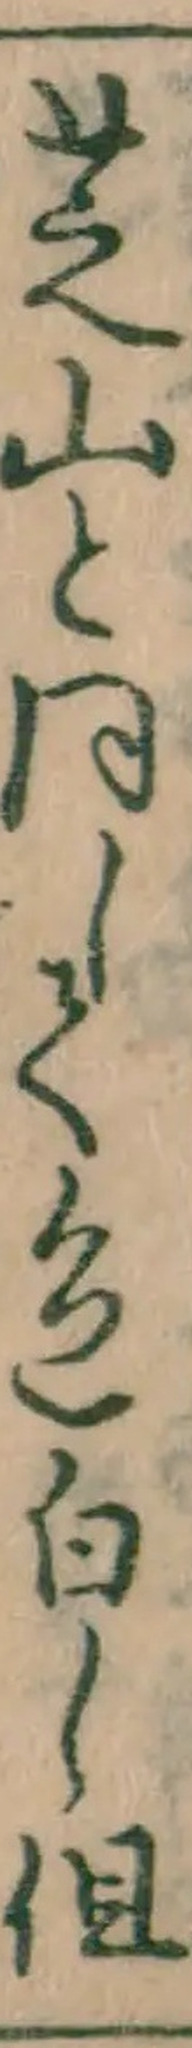芝山と同して色白し但
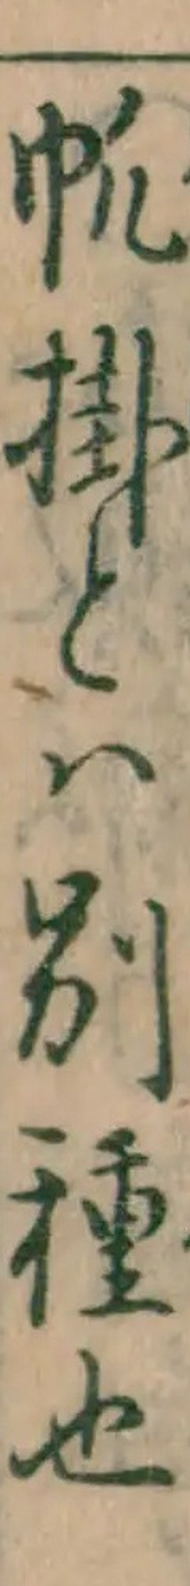帆掛とは別種也

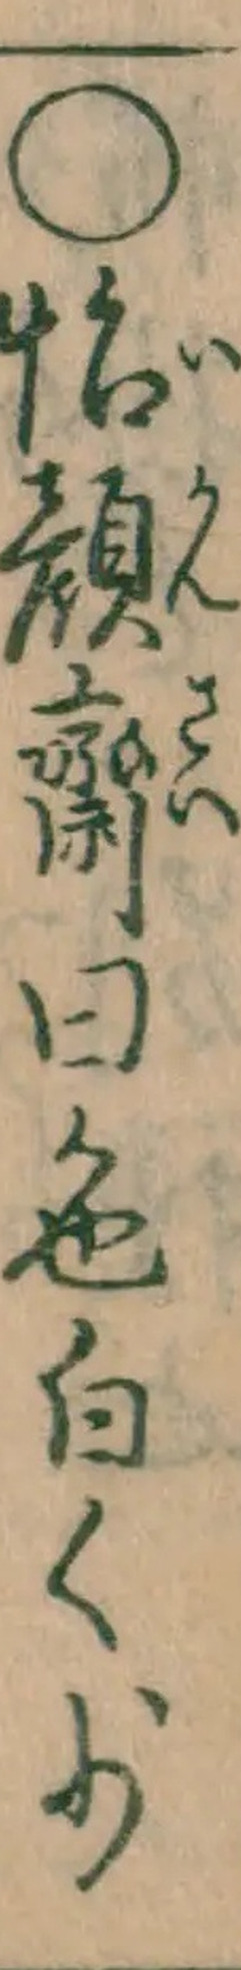○怡顔斎曰色白く少
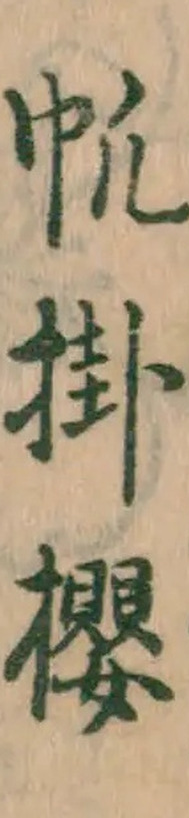帆掛桜
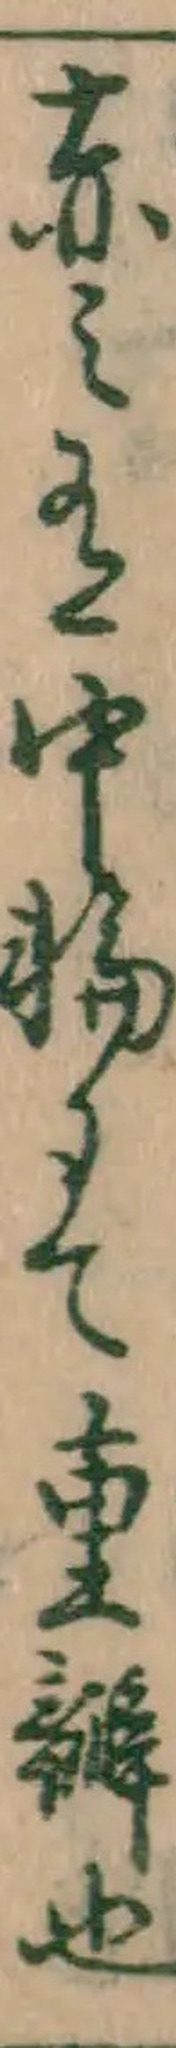赤み有中輪にて重弁也
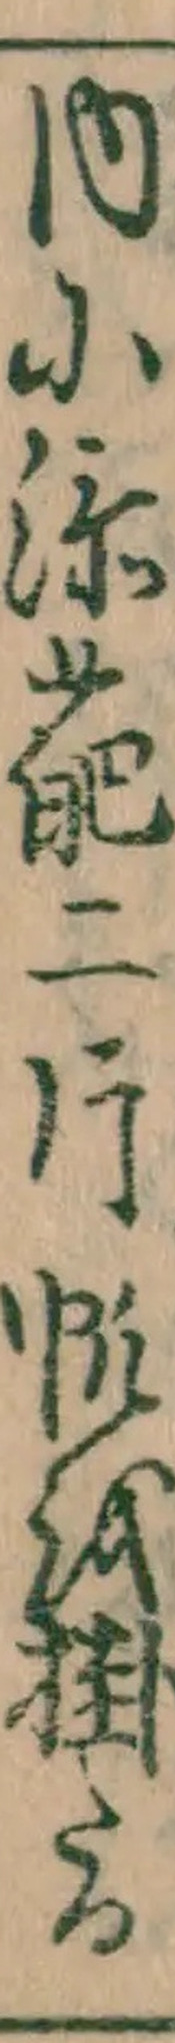内に添葩二片帆を掛たる
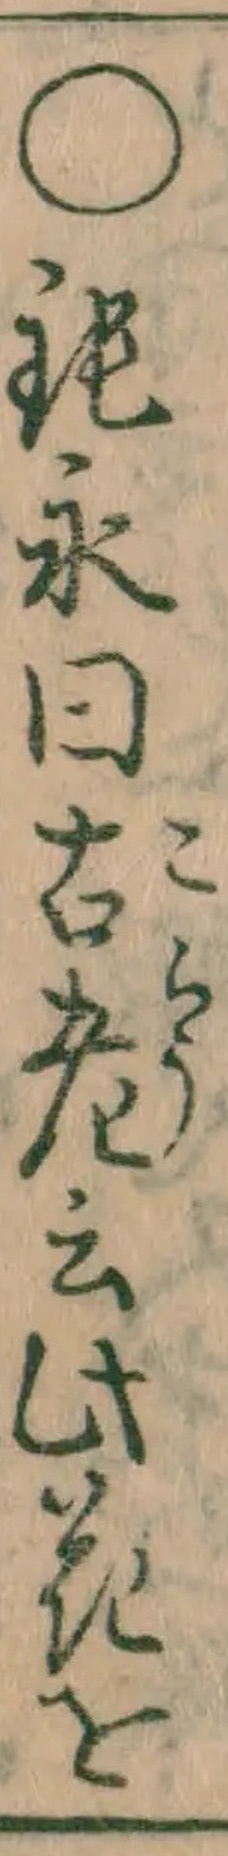○鈍永曰古老云此花を
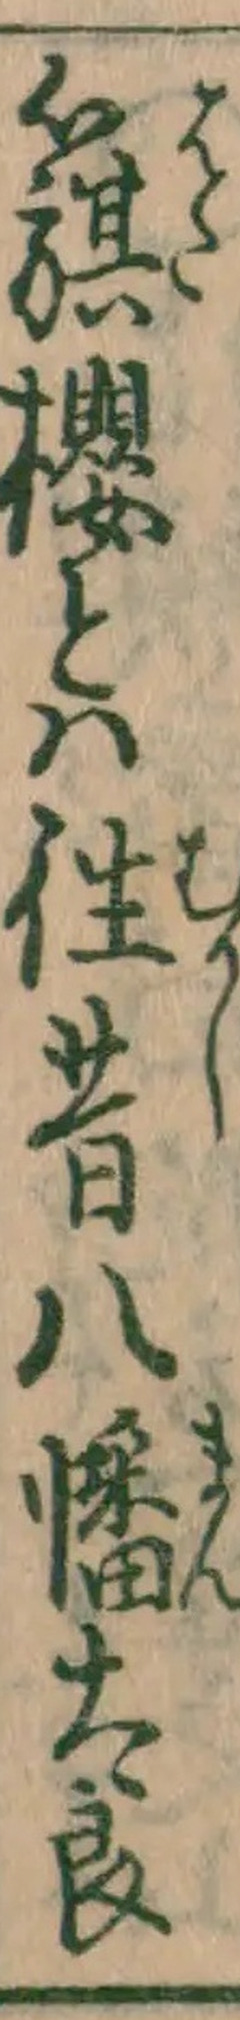籏桜とは往昔八幡太郎
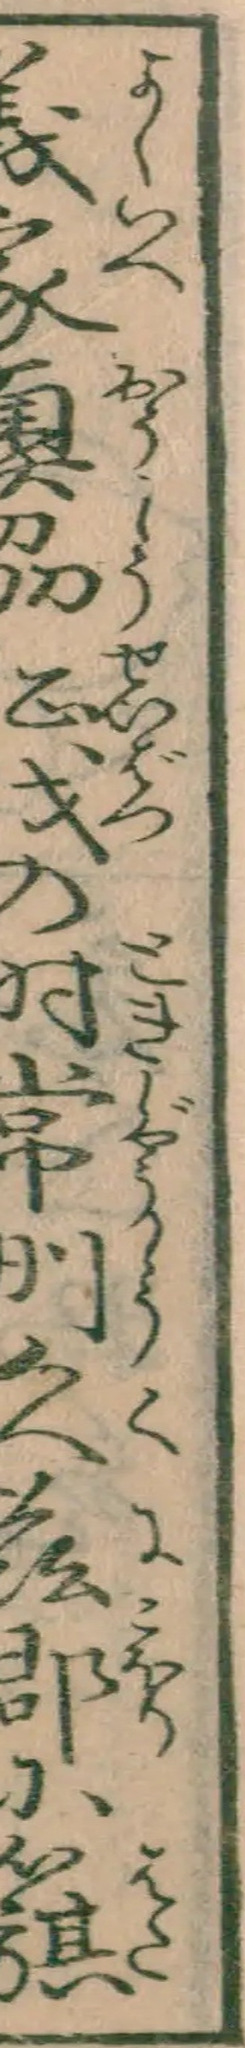義家奥州征伐の時常州久茲郡に籏
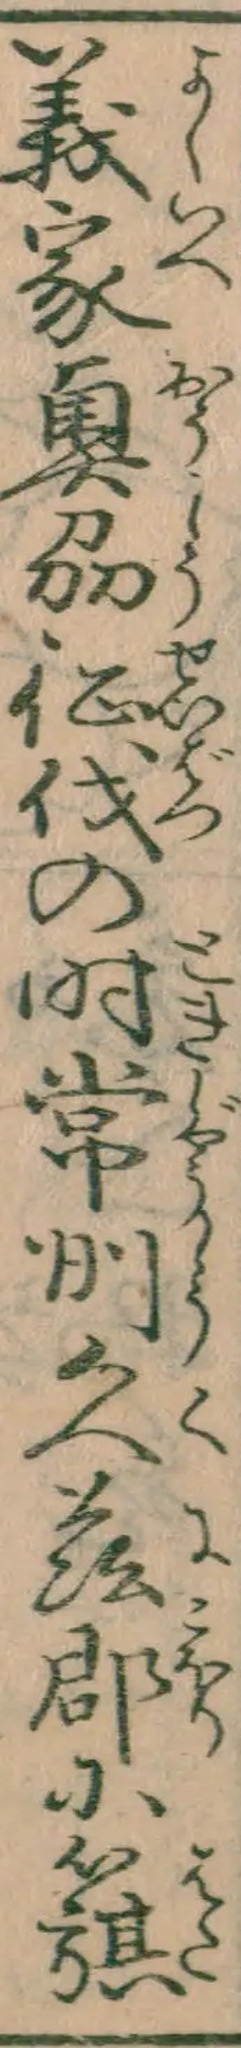義家奥州征伐の時常州久茲郡に籏
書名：怡顔齋櫻品
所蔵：国立国会図書館 National Diet Library, JAPAN
